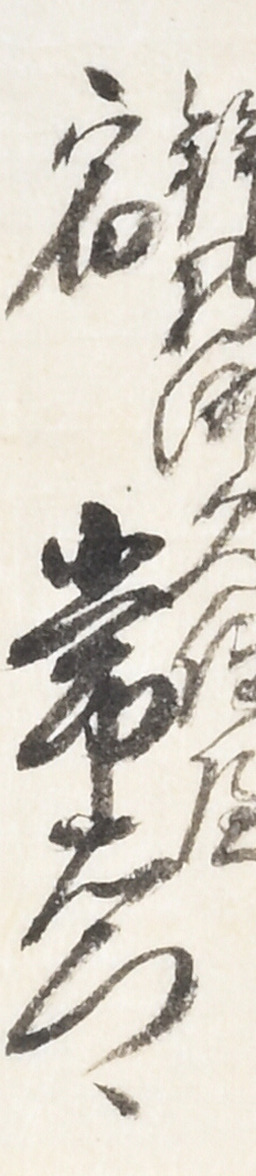宿常右衛門・
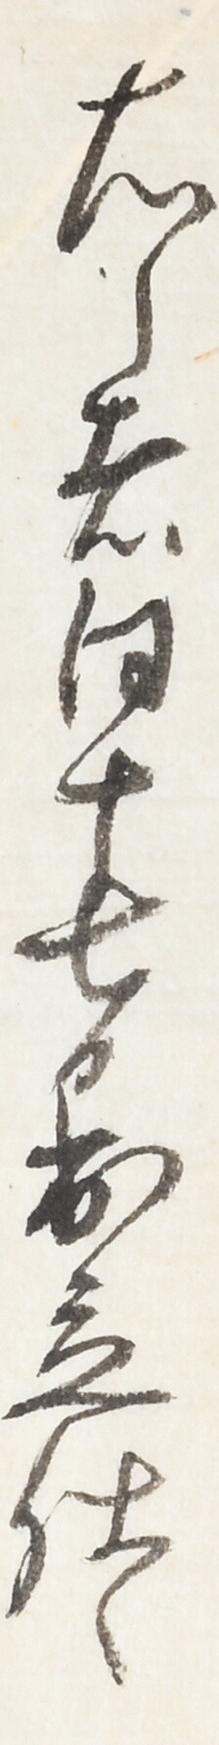右之者同十七日出立仕候
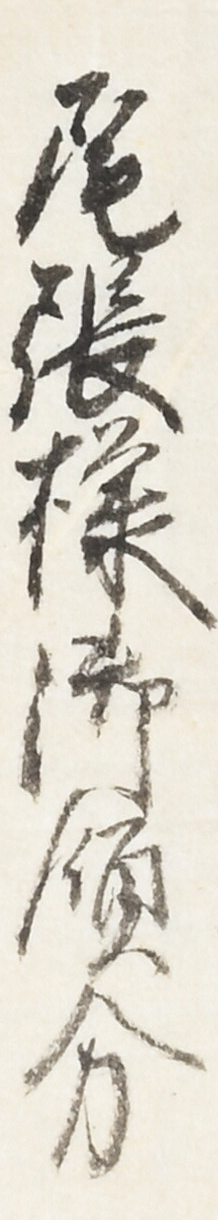尾張様御領分
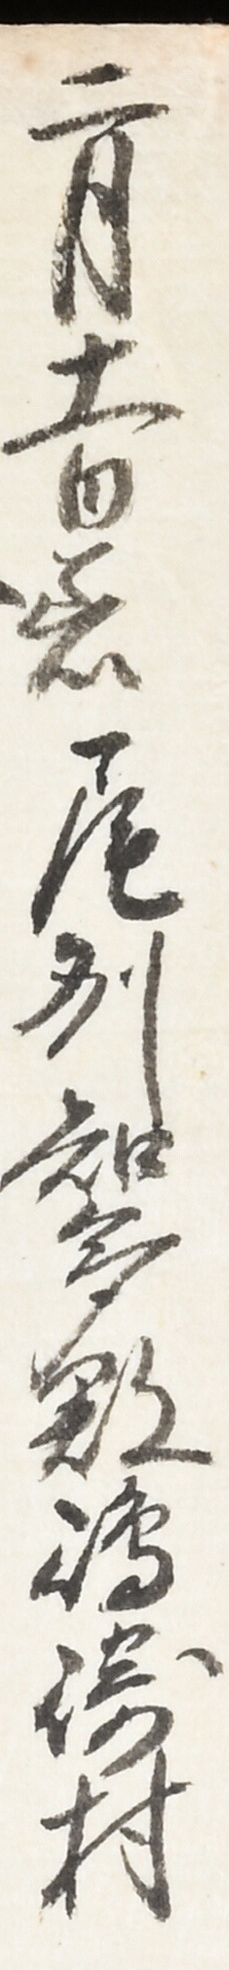二月十一日着尾州知多郡嶋崎村
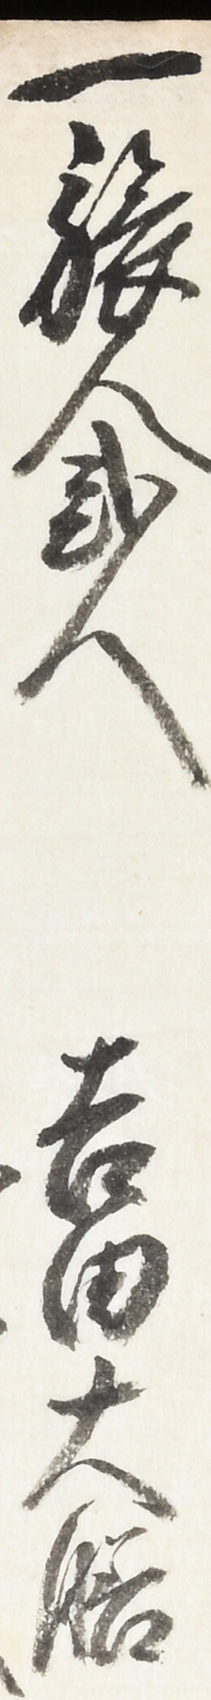一旅人弐人吉田大膳
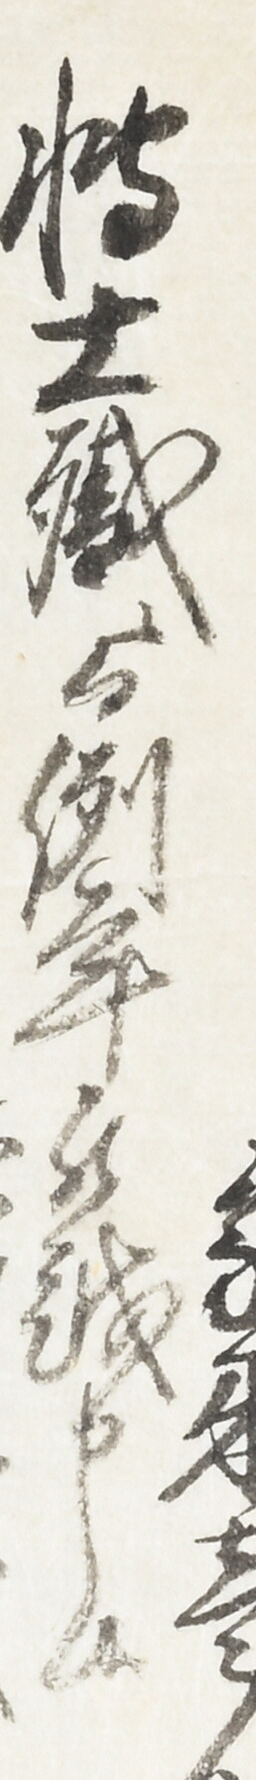転士職ニ而例年罷越申候
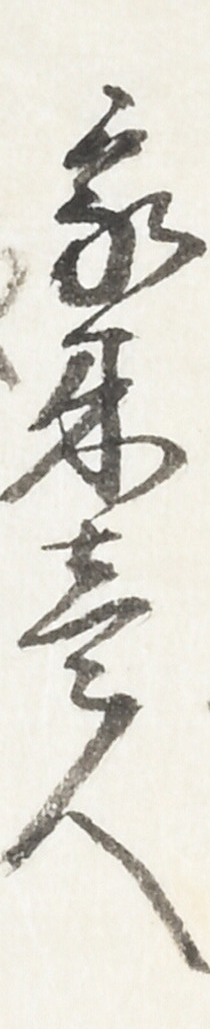家来壱人
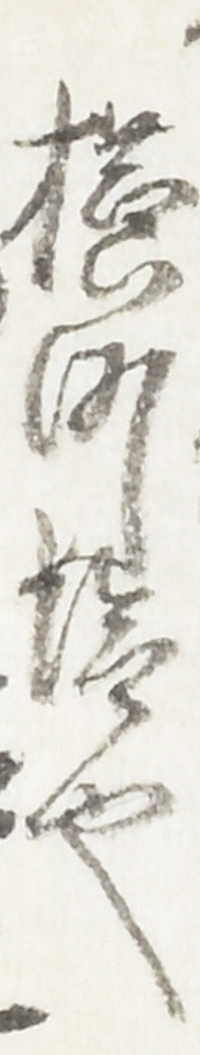横町塩屋
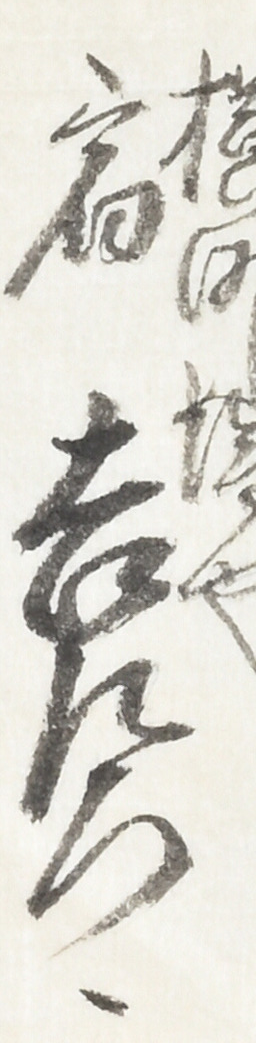宿吉左衛門・
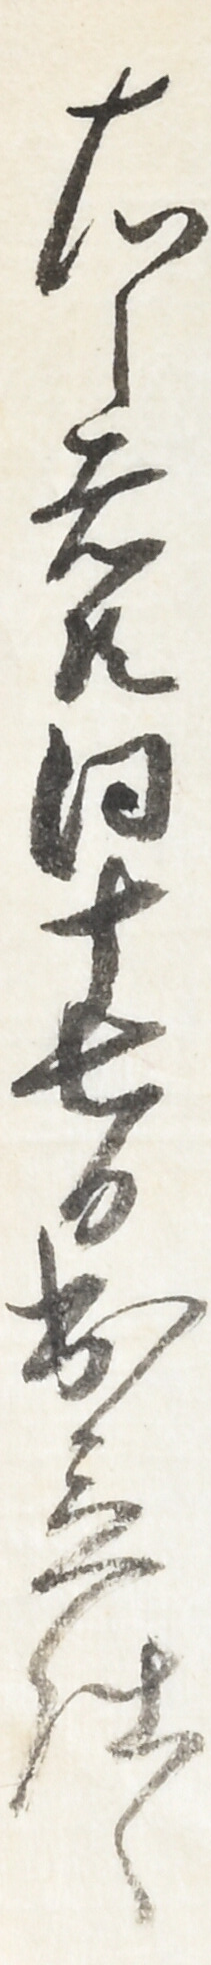右之者共同十七日出立仕候

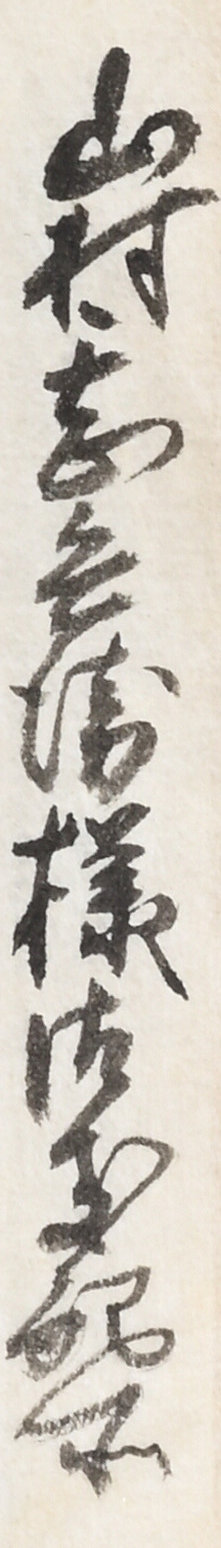山村甚兵衛様御支配所
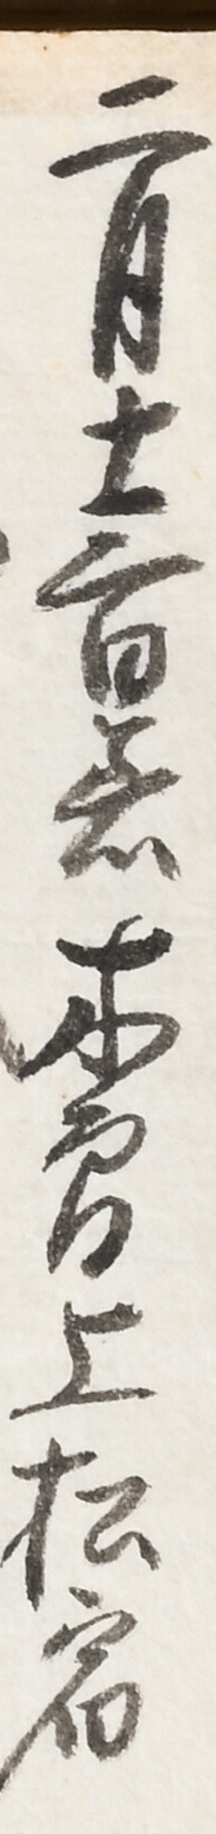二月十三日着木曽上松宿
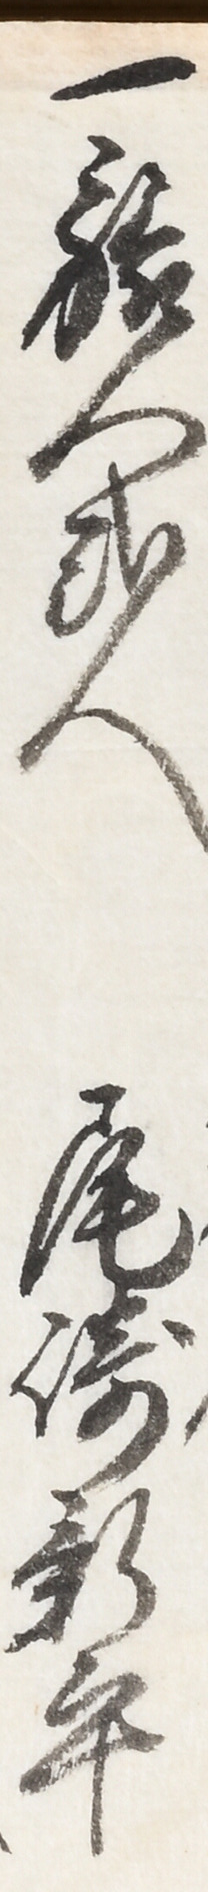一旅人弐人尾崎新平
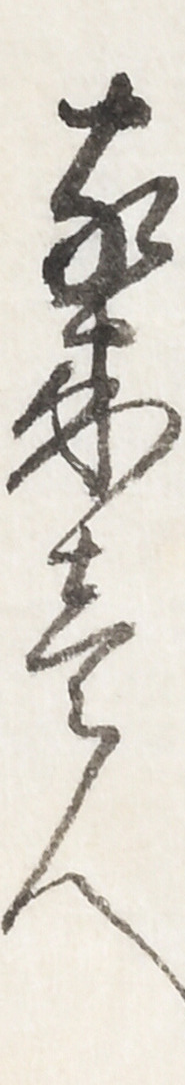家来壱人
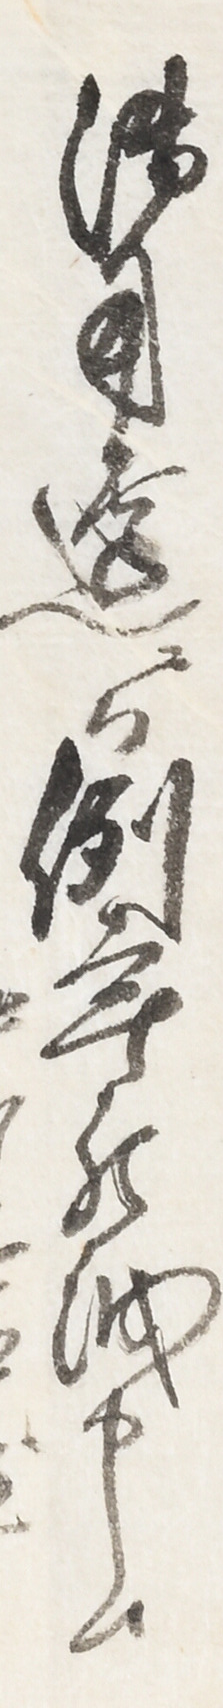御用達ニ而例年罷越申候
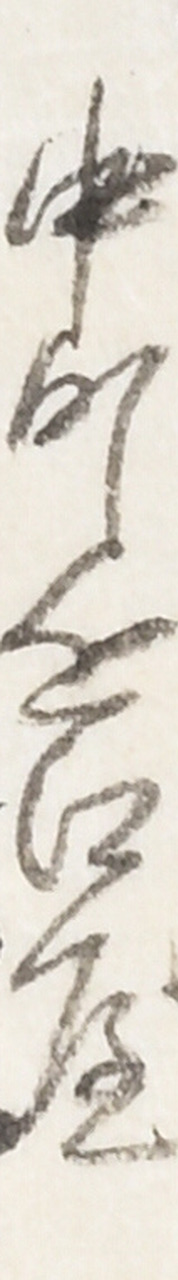中町近江屋
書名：旅人泊控帳
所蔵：伊那市立高遠町図書館・合同会社AMANE
